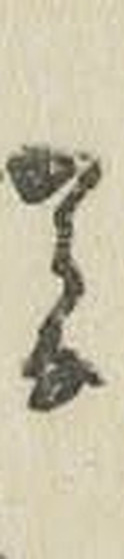からな
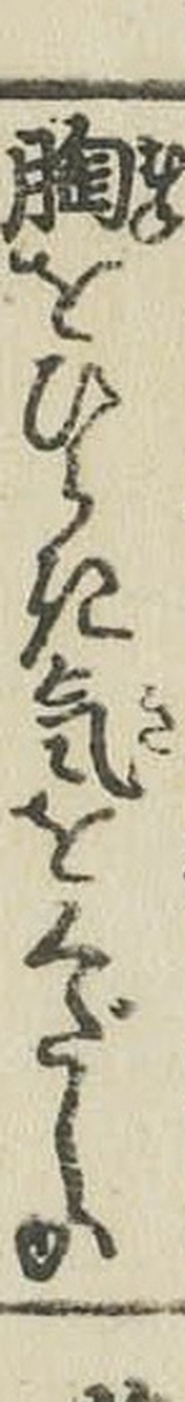胸をひらき気をくだしか
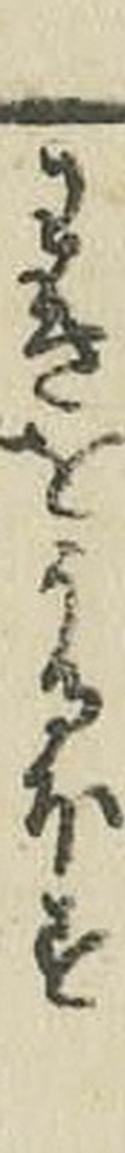わきをうるほす
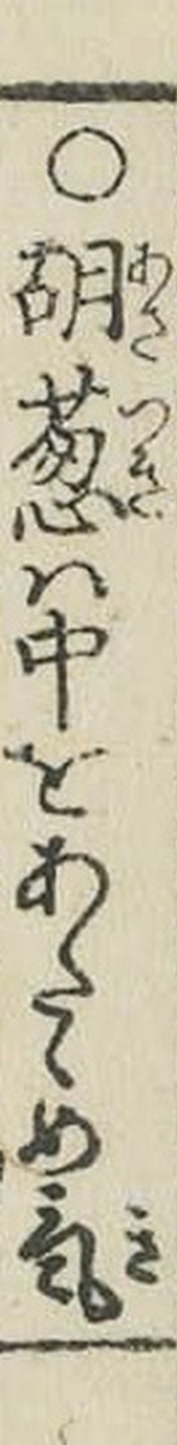○胡葱は中をあたゝめ気
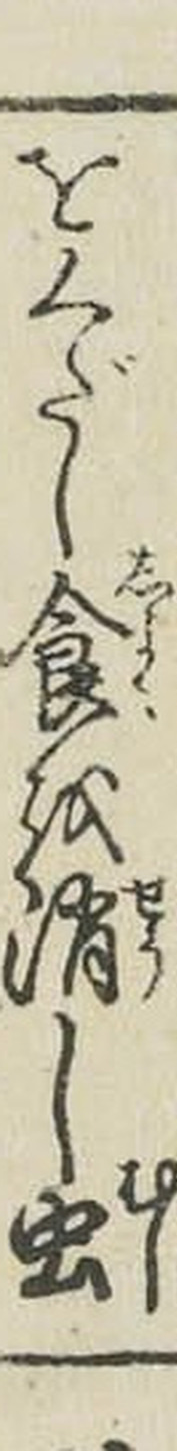をくだし食を消し虫
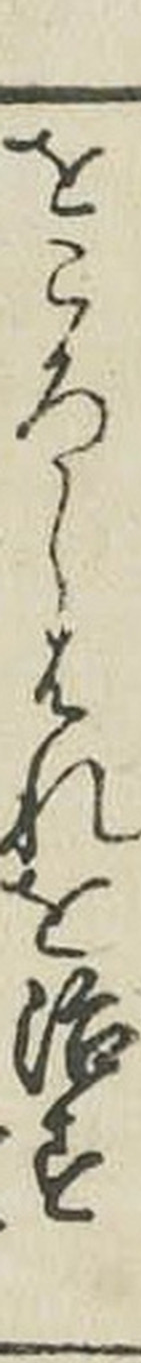をころしはれを治す
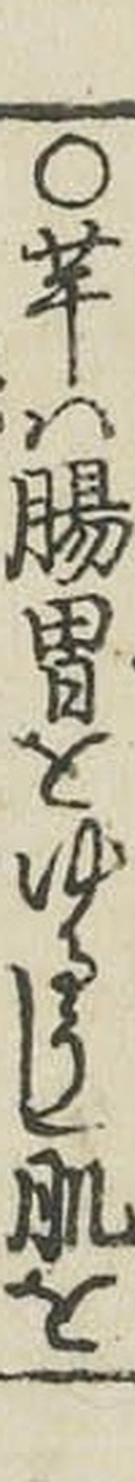○芋は腸胃をゆるかし肌を
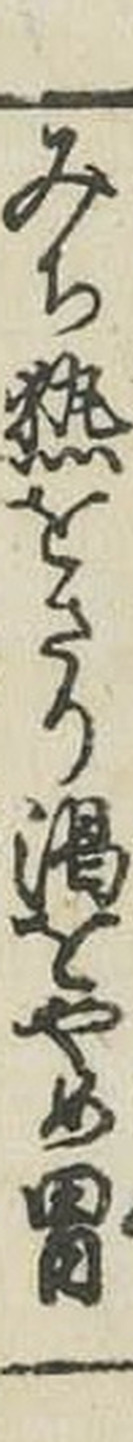みち熱をさり渇をやめ胃
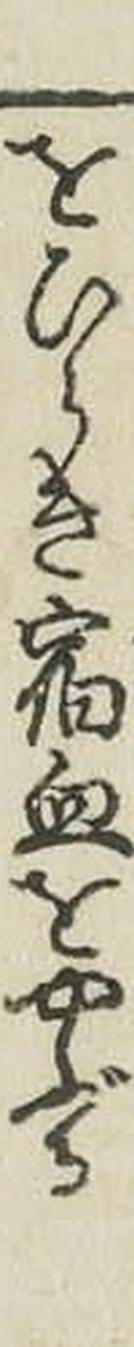をひらき宿血をやぶる
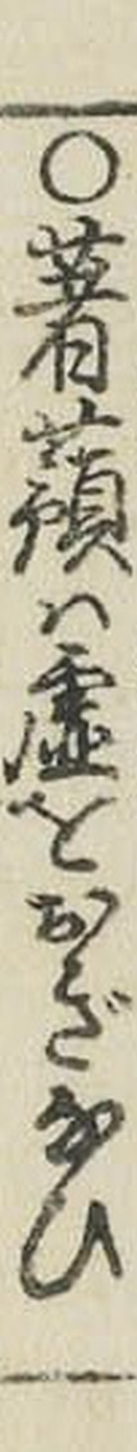○著蕷は虚をおぎなひ
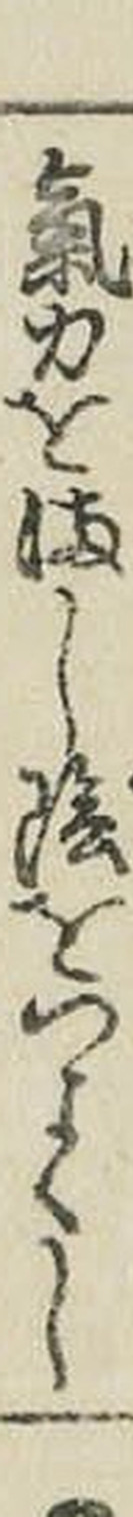気力をまし陰をつよくし
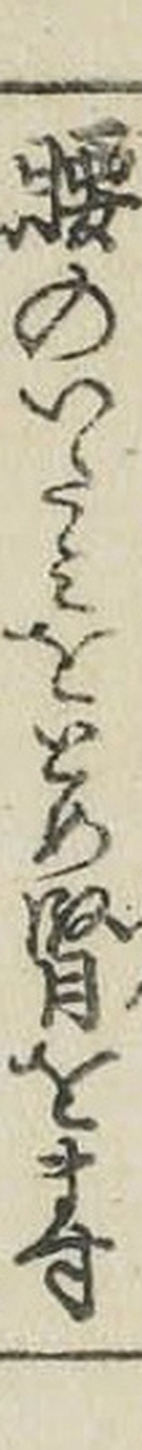腰のいたみをとめ腎をます
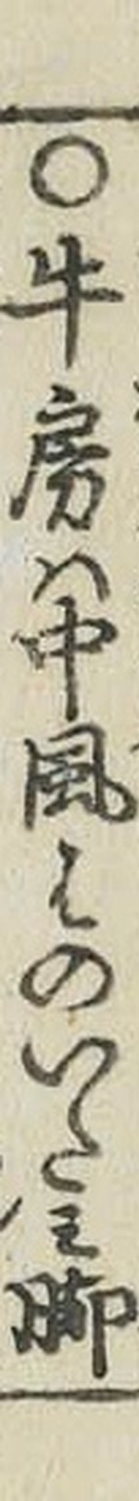○牛房は中風はのいたみ脚
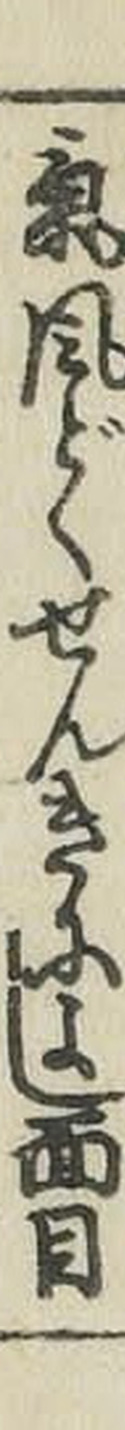気風どくせんきによし面目
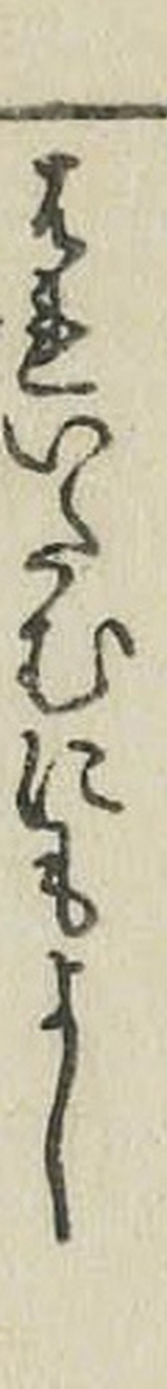はれいたむにもよし
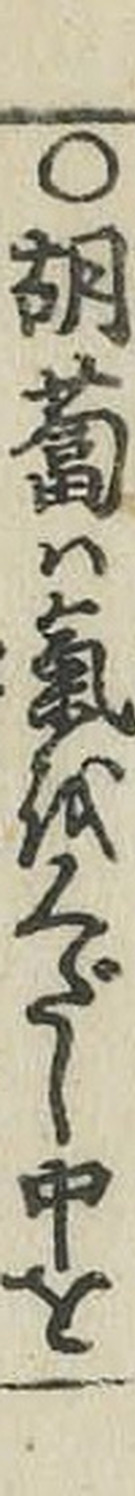○胡蔔は気をくだし中を
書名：増補頭書訓蒙図彙大成 10巻 8:巻之17-19
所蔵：東京学芸大学教育コンテンツアーカイブ
